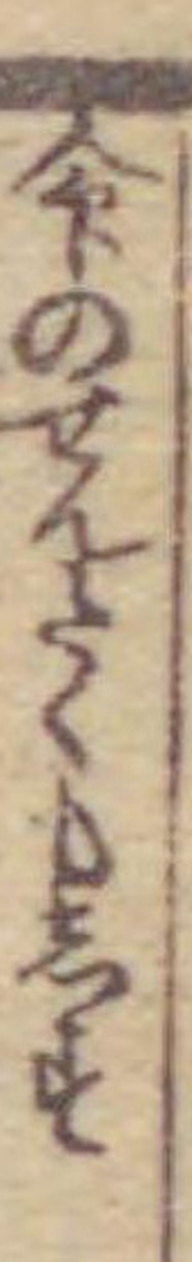命のせんたくもしす
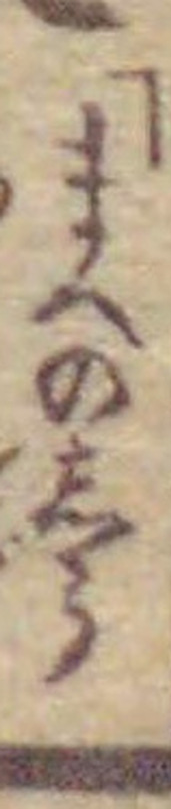〽まへのしう
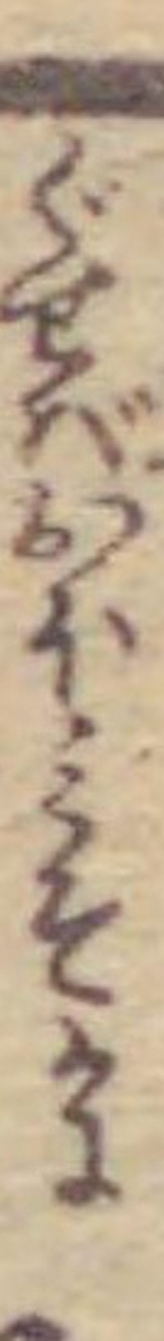ぐせばおほみそかに
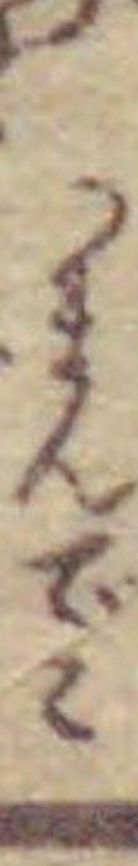つまんでこ
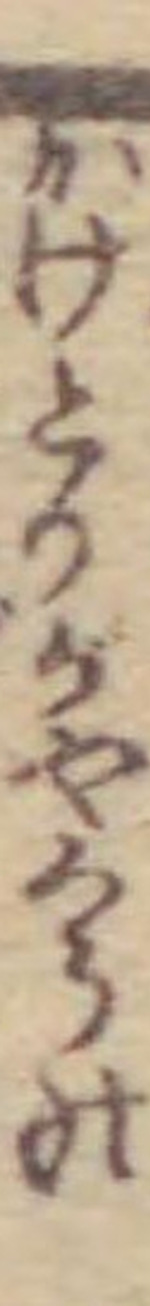かけとりがやろうの
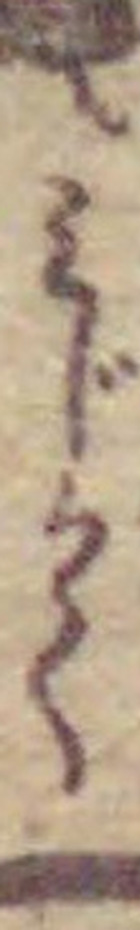みじかく
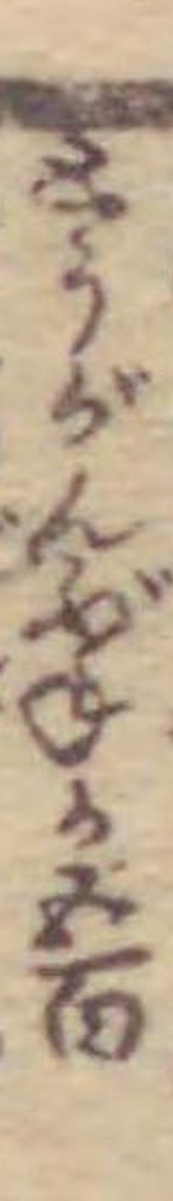とうがんぶねか五百
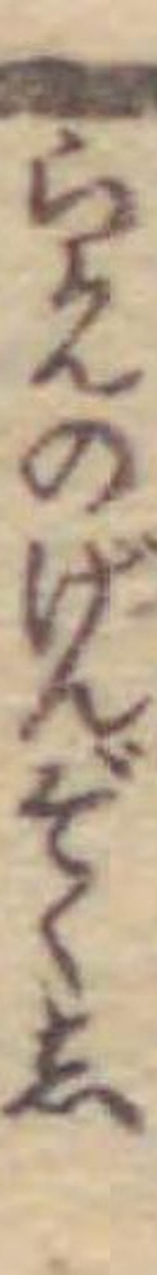らかんのげんぞくし
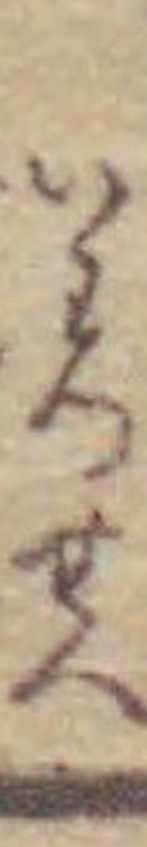いわつせへ
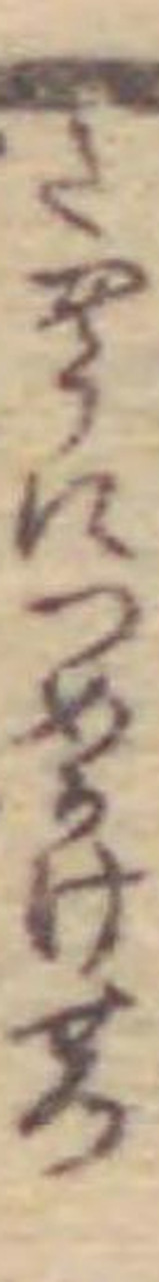たやうにつめかけせつ
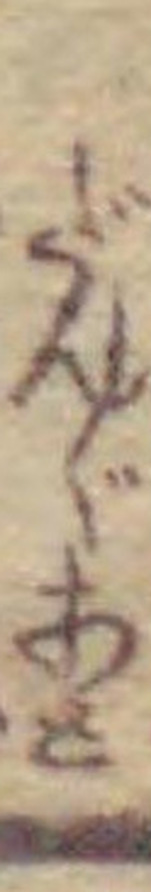だん〴〵あと
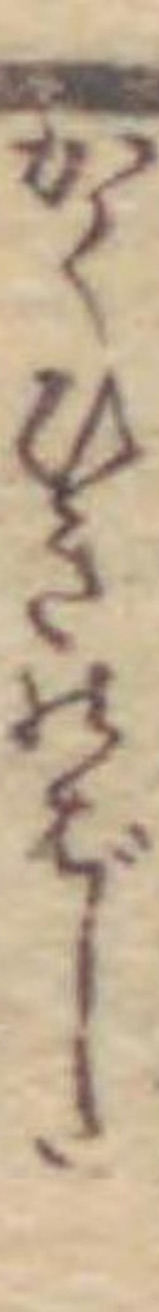かくひきのばした
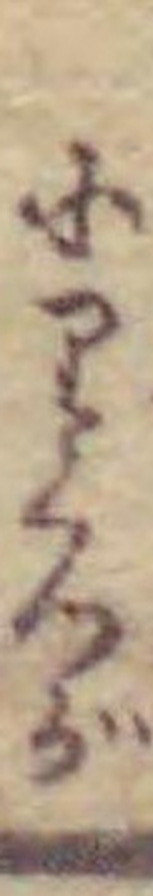にりくつが
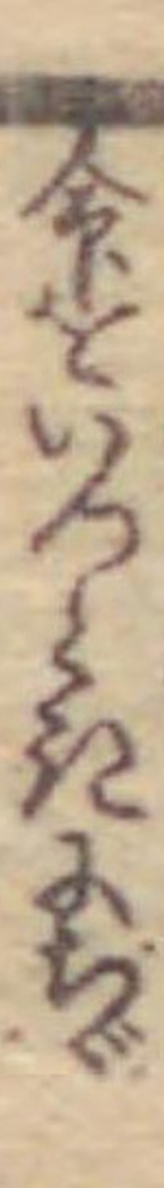命をいつときにちゞ
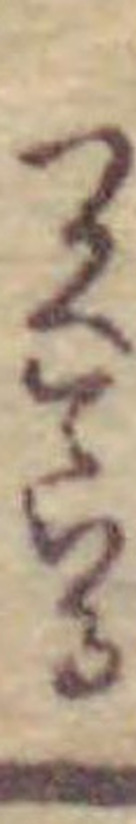つかへている
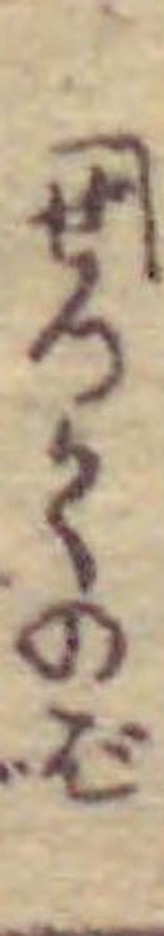〽せつかくのば
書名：御誂染長寿小紋 : 3巻
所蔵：国立国会図書館 National Diet Library, JAPAN
